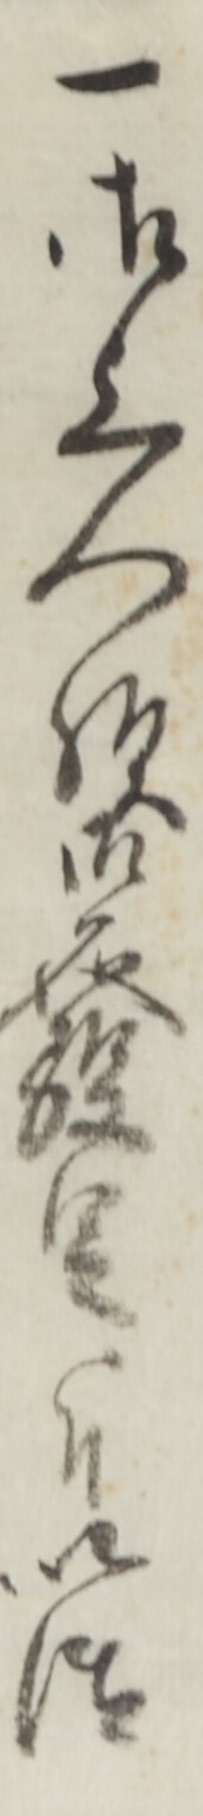一御上人様御発足ニ付以御
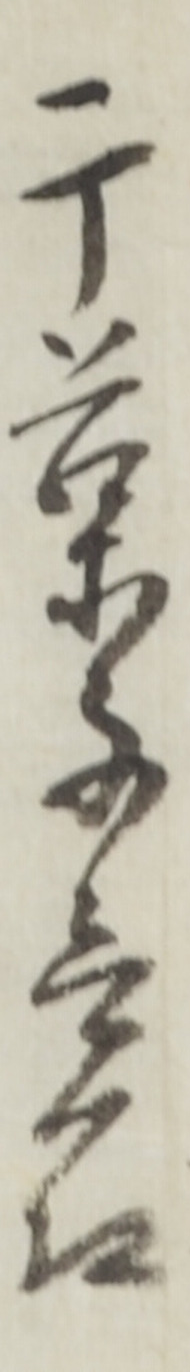干菓子壱箱
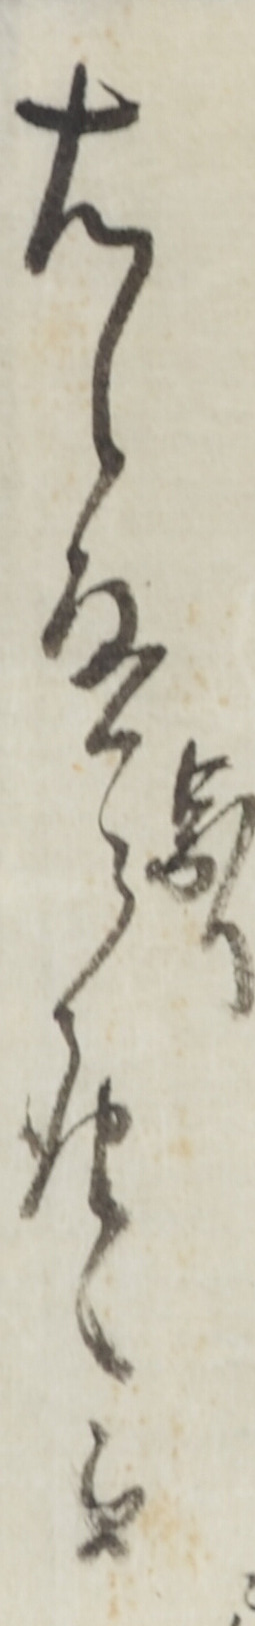右之通ニ御座候義
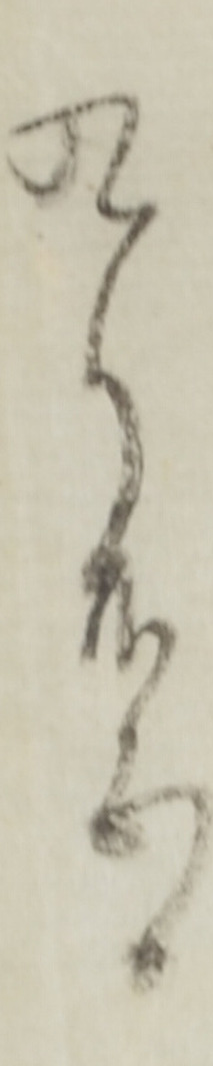九月廿五日
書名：（覚書）
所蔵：伊那市立高遠町図書館・合同会社AMANE
